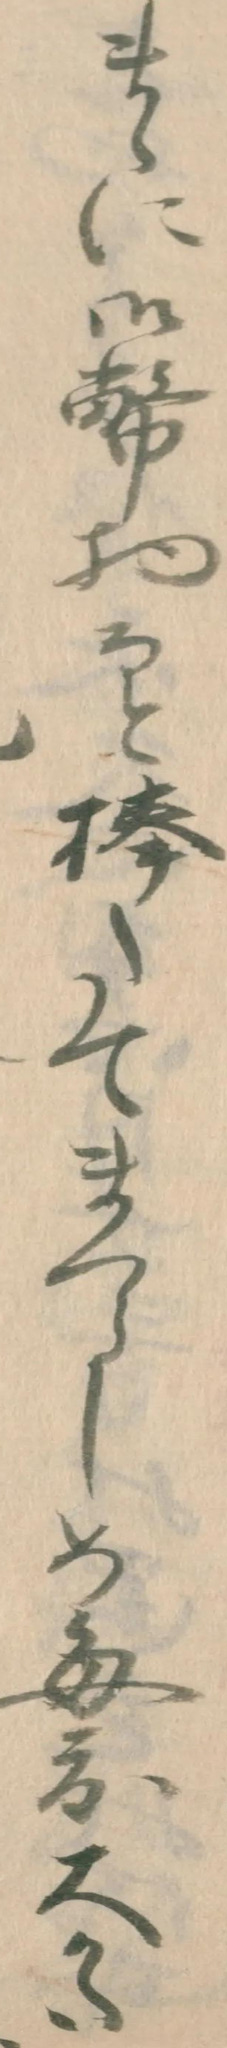まゝに御幣物なと捧たてまつらしめ毎度大かたは
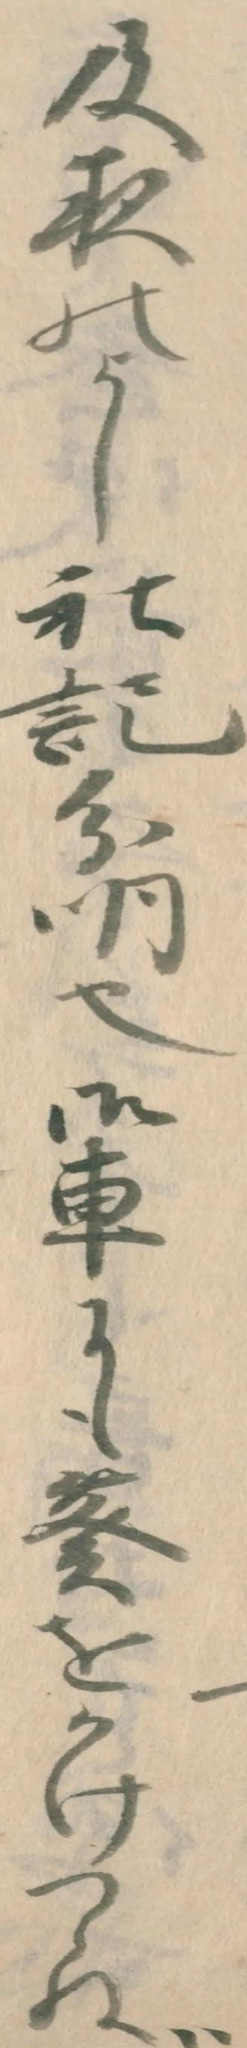及夜のよし社記分明也御車にも葵をかけつらね
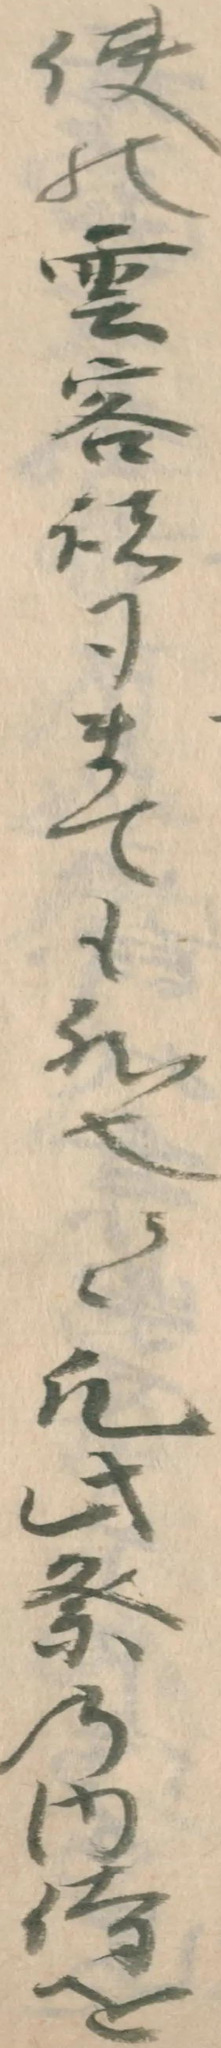使の雲客諸司まても然也云々凡此祭の内侍を
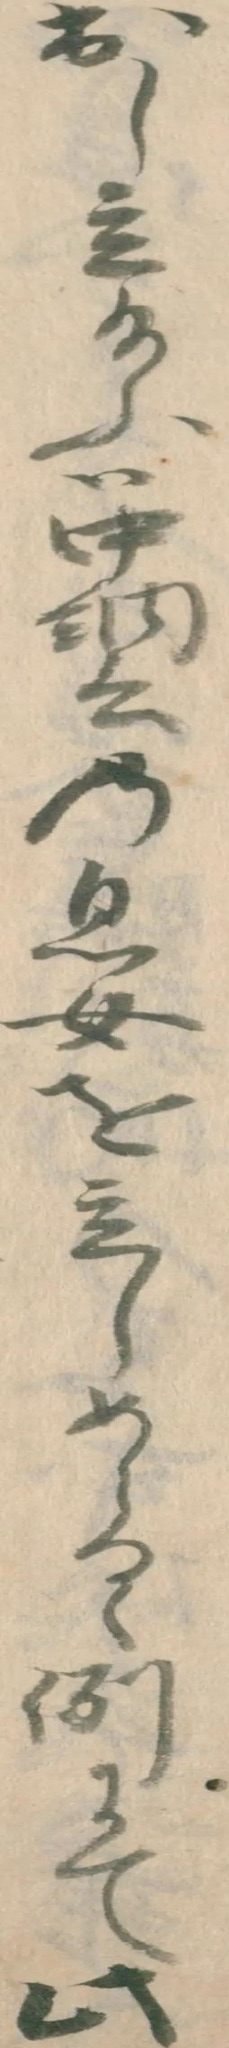出し立給ふは中納言の息女を立しめらるゝ例にて此
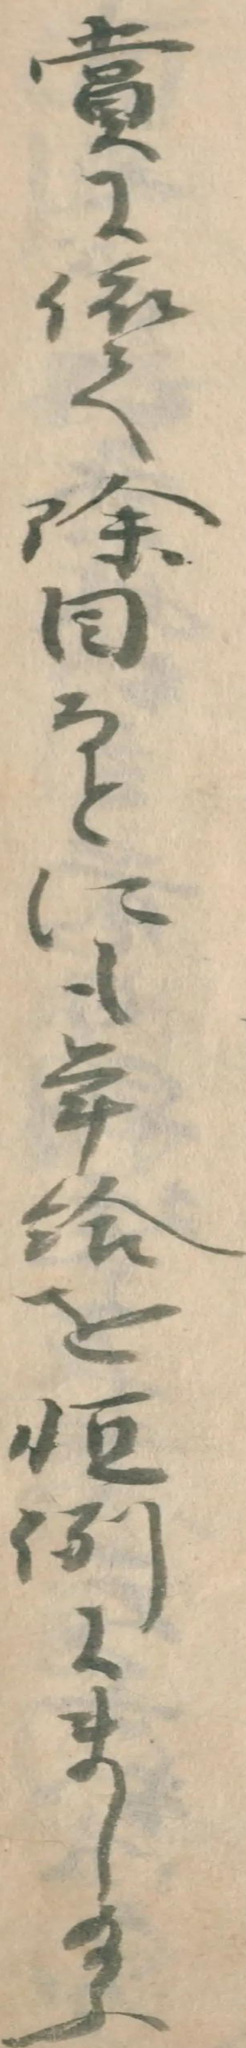賞に依て除目なとにも年給を恒例にまし給ふ

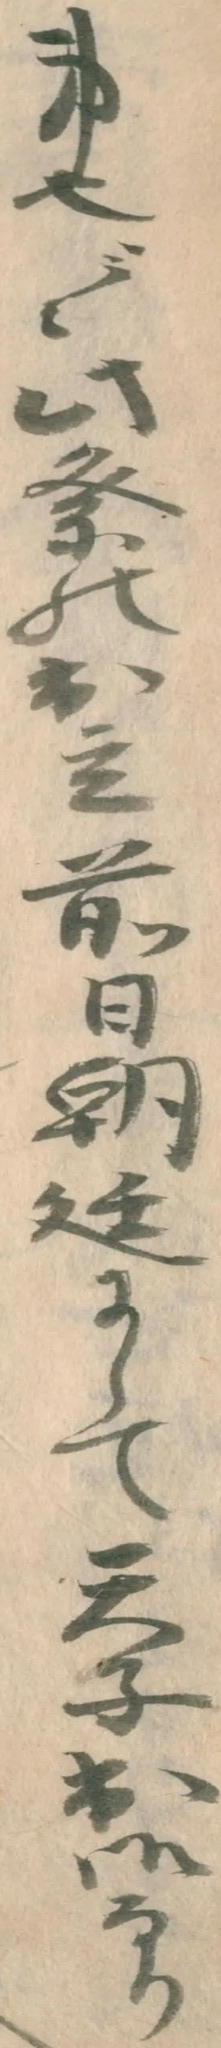事也云々此祭の出立前日朝廷にして天子出御なり
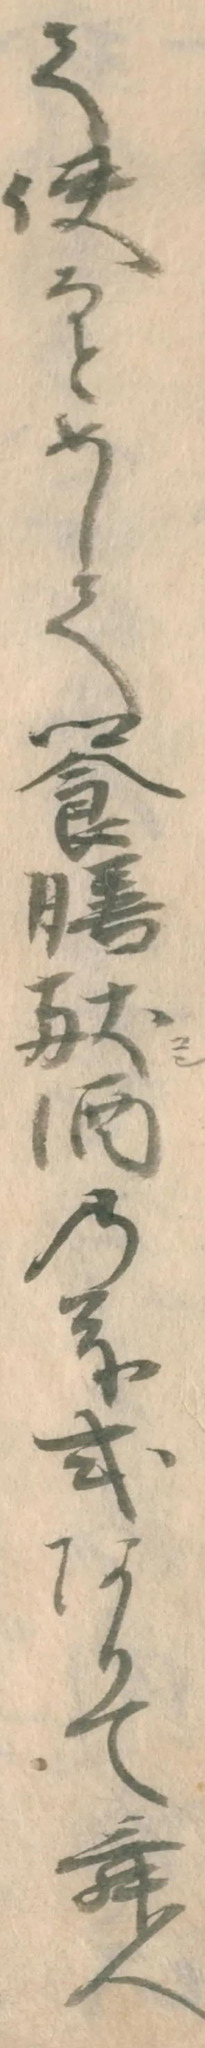て使なとめして饗膳献酒の義式ありて舞人
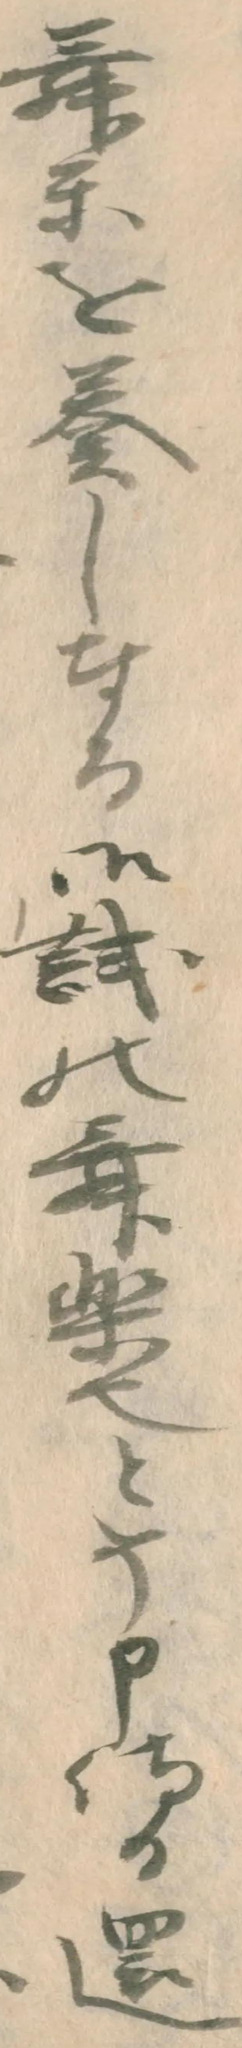舞楽を奏し奉る御-試の舞楽也とそ申侍る還
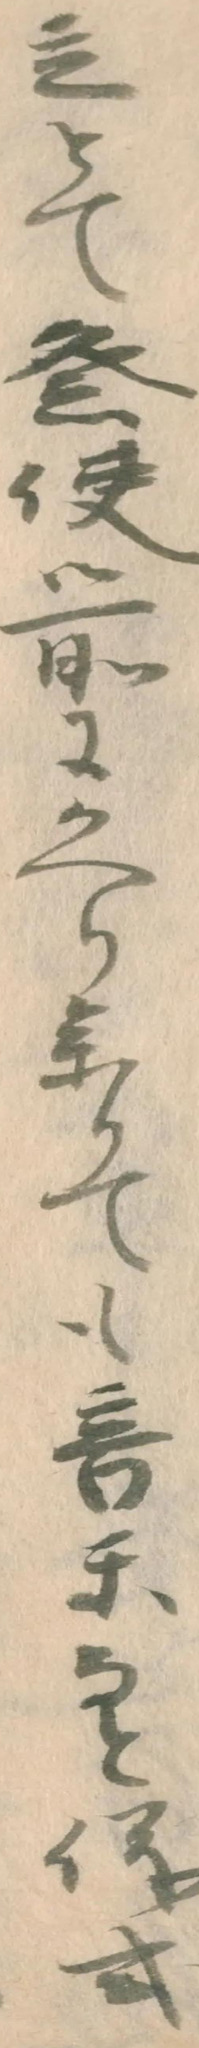立とて祭使御所にかへり参りても音楽なと儀式
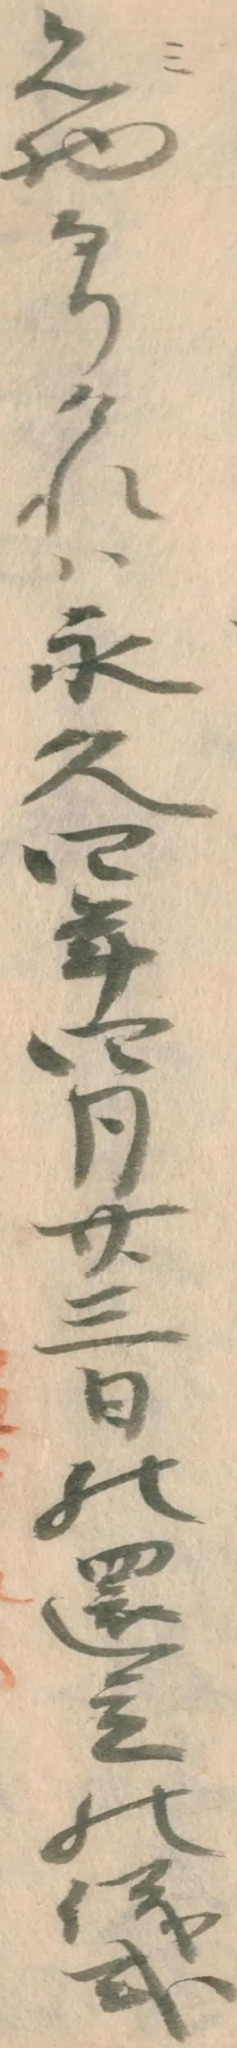見物なりけれは永久四年四月廿三日の還立の儀式
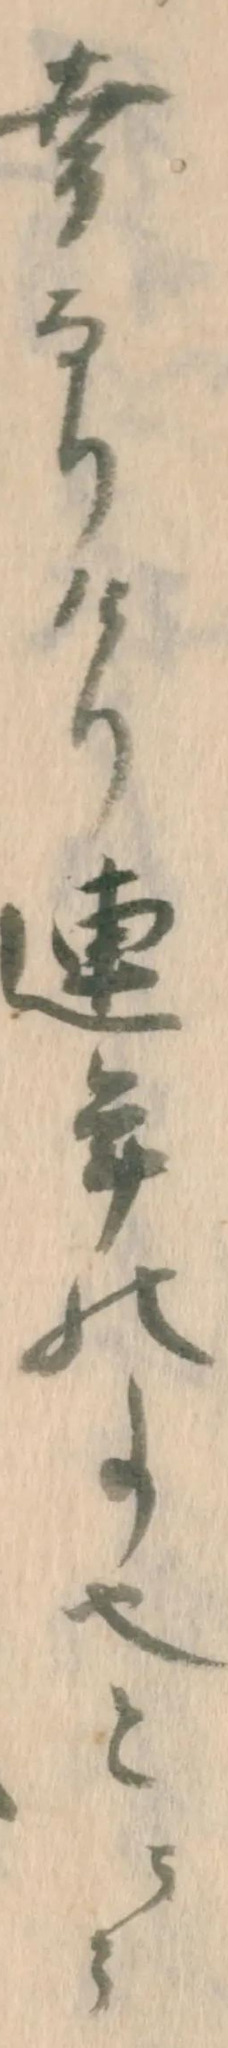幸なりけり連年の事也と云々
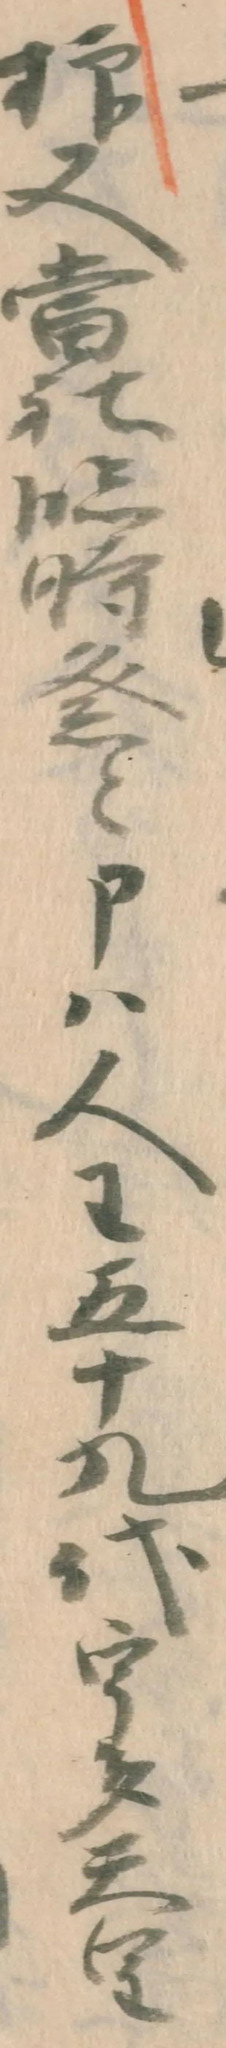抑又当社臨時祭と申は人王五十九代宇多天皇
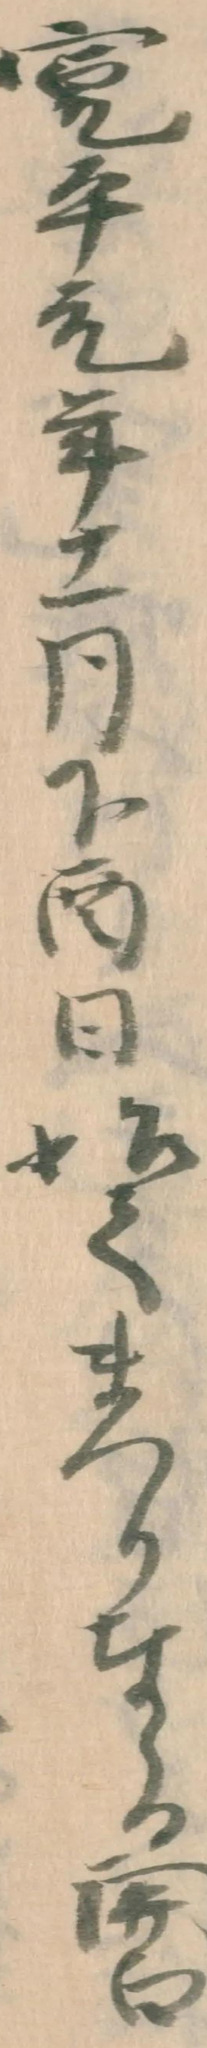寛平元年十一月下酉日始てまつり奉る関白
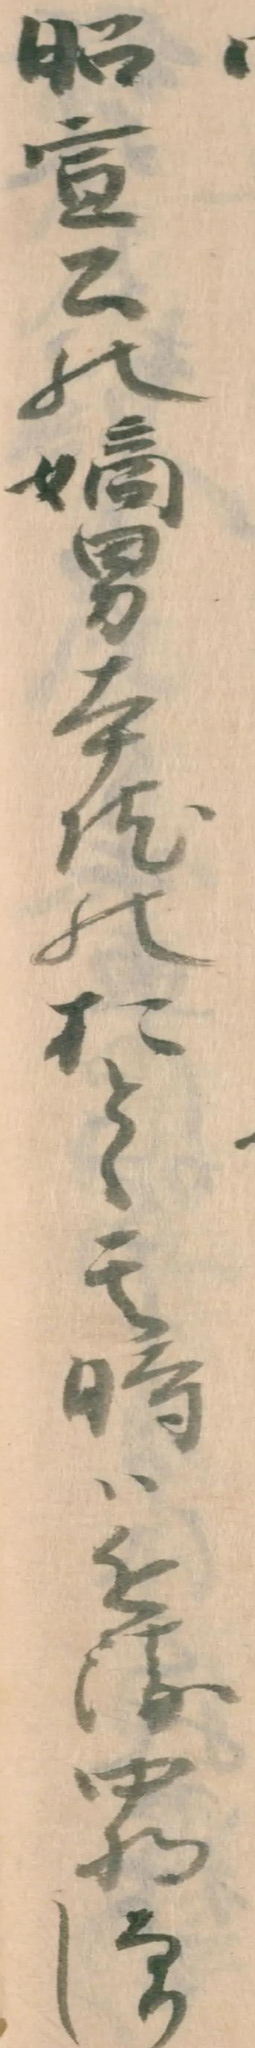昭宣公の嫡男本院のおとゝ其時は近衛中将なりし
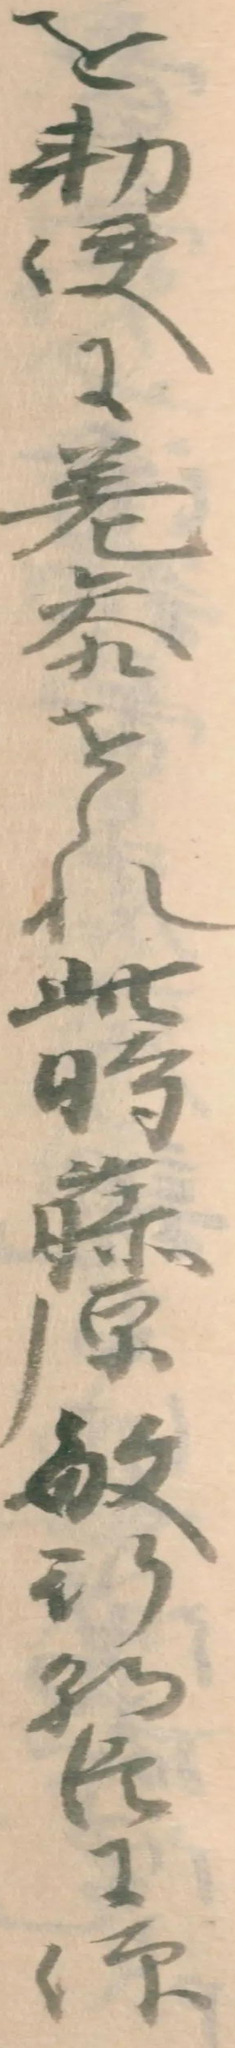を勅使に差参せられ此時藤原敏行朝臣に仰
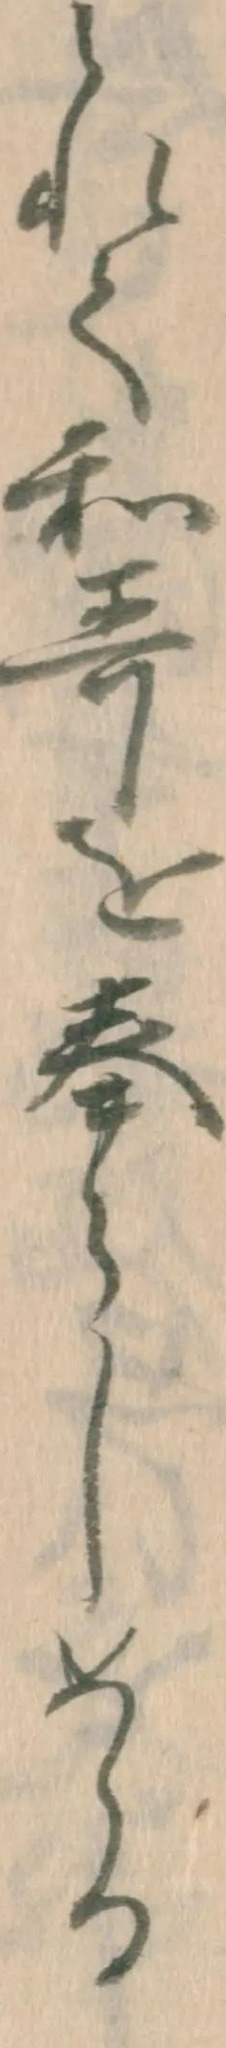られて和哥を奉らしめらる
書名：賀茂社記録. 第1冊
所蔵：国立国会図書館 National Diet Library, JAPAN
